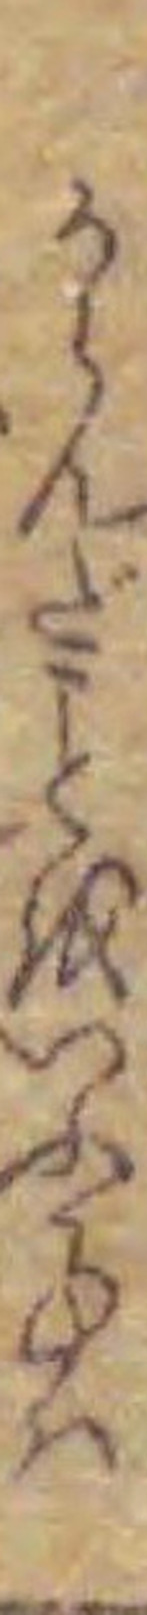からんだことをいふ事は
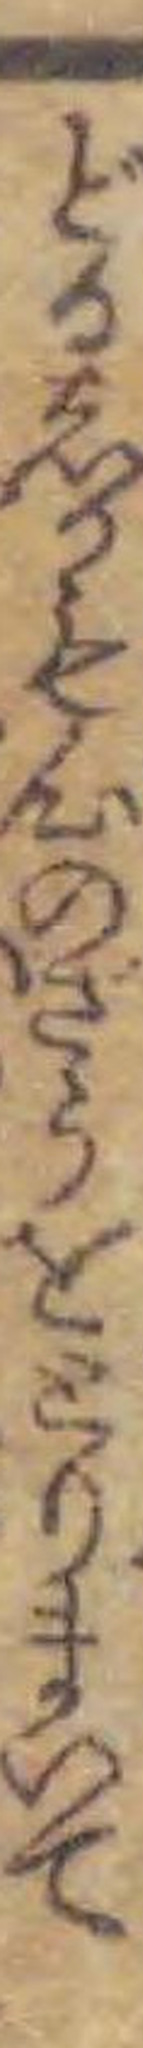どるしかも心のざうをとりまいて
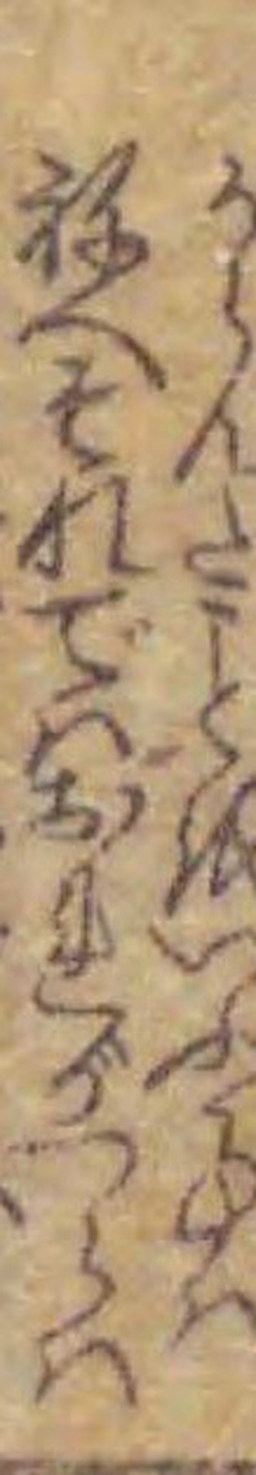ねへそれではおれがつらは
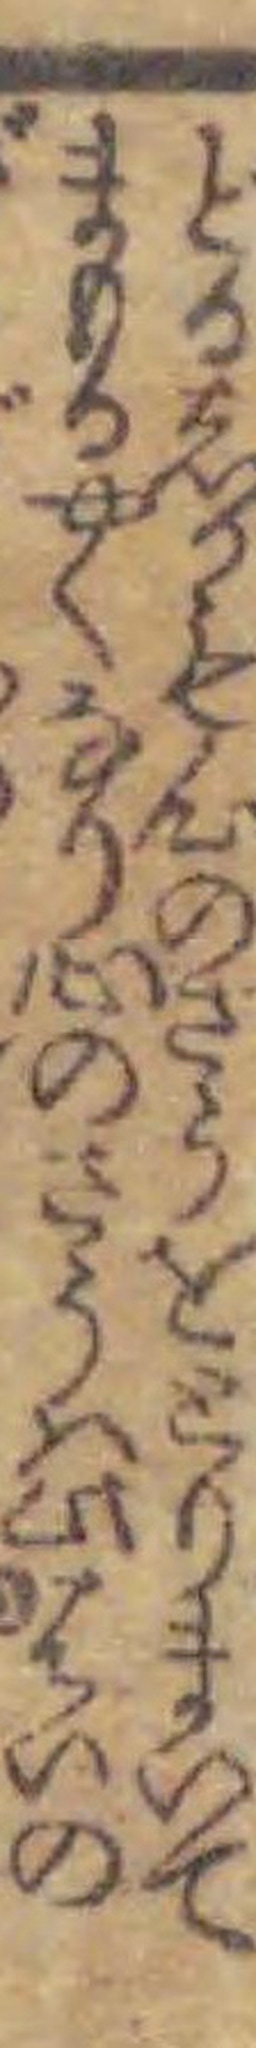まもるやくなり心のさうは此はいの
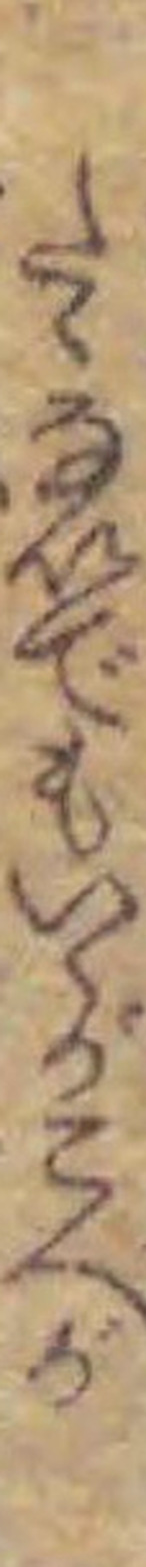たゝないでもいゝがこへが
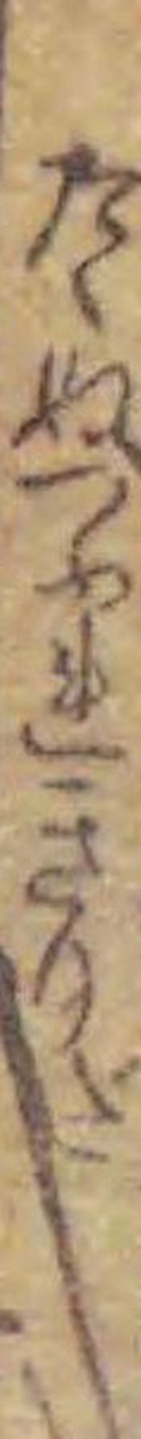たゝぬつふれきりだ
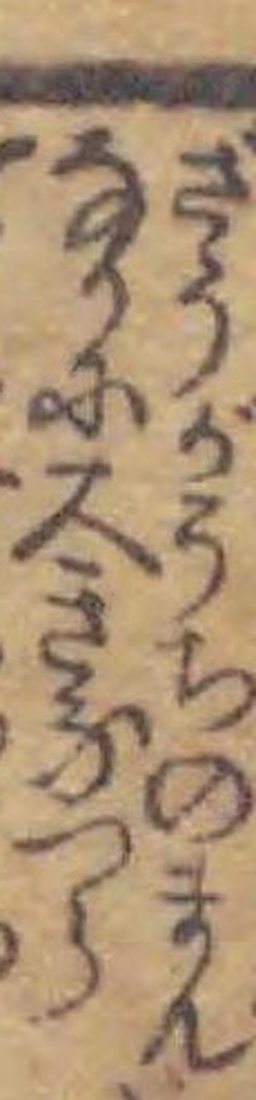なかに大きなつら
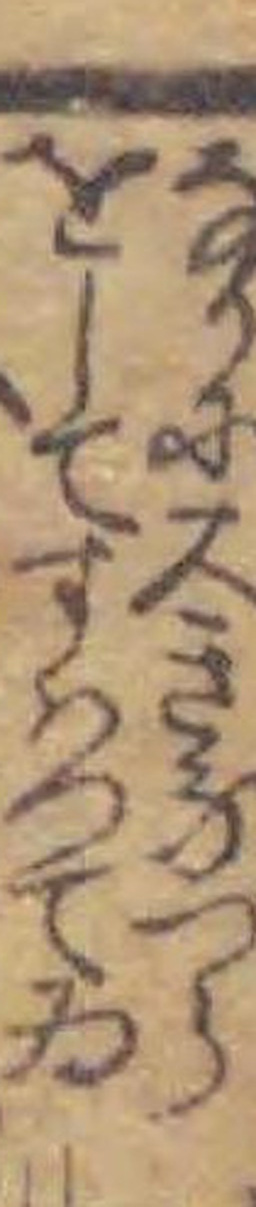をしてすはつてゐ
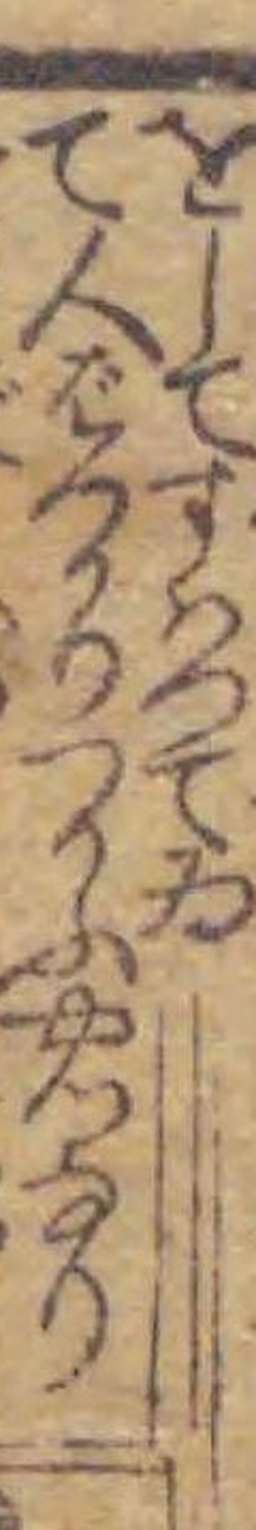て人ばつかりつかふやつなり
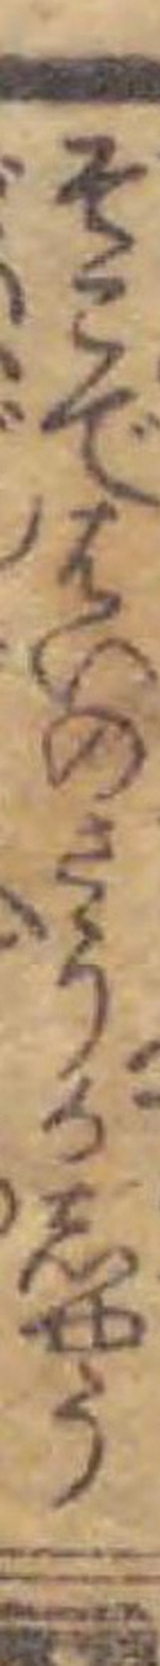そこではいのさうかしやう
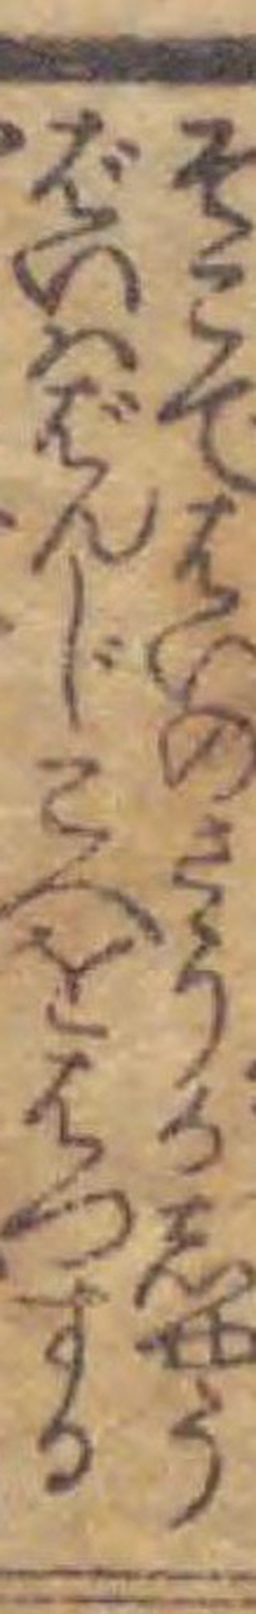ばいはばんじこへをはつする
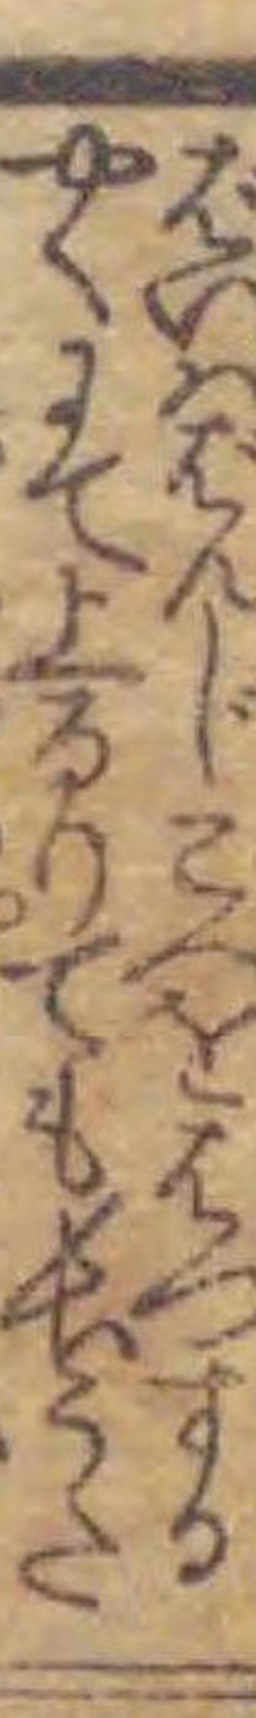やくにて上るりても長うた
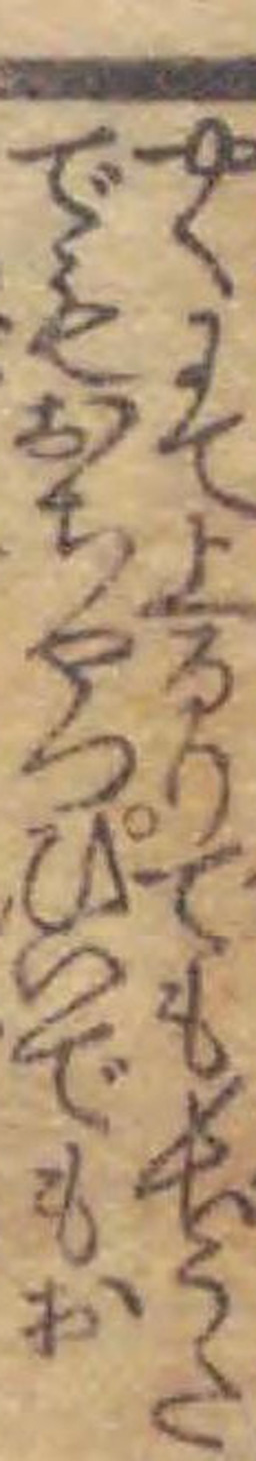でもおちやつぴいでもお
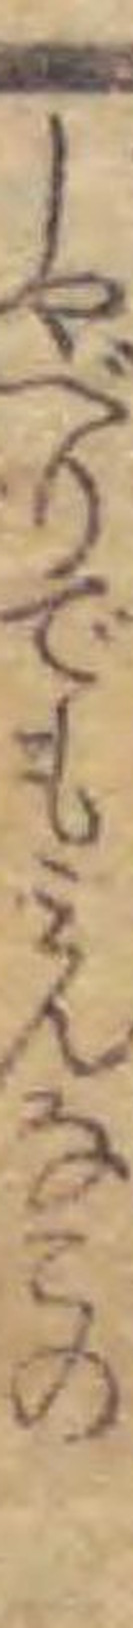しやべりでもみんなこの
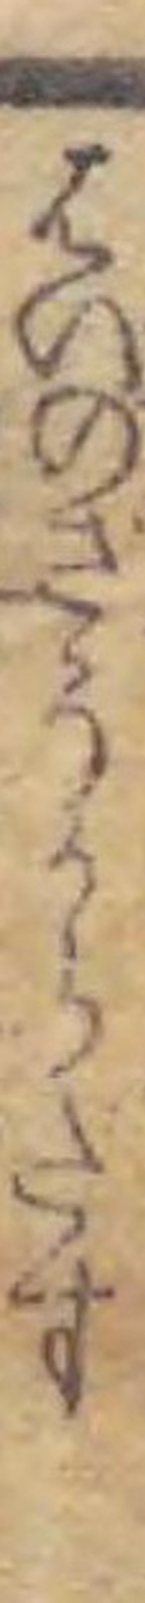はいのざうからだす
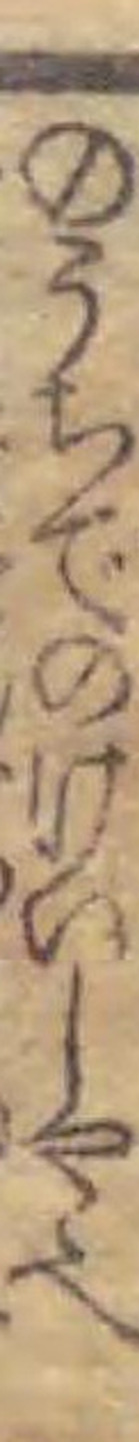のうちでのけいしや也
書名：十四傾城腹之内 : 3巻
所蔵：国立国会図書館 National Diet Library, JAPAN
